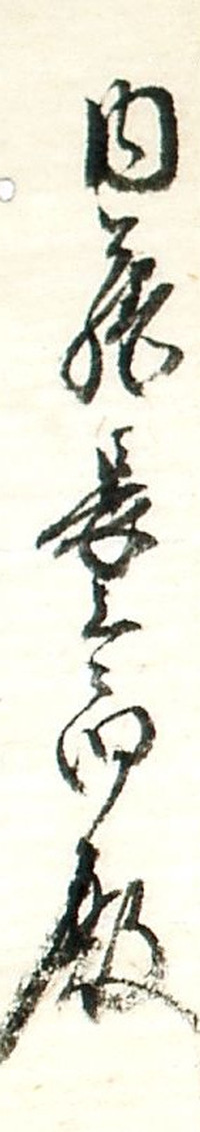内藤長三郎殿
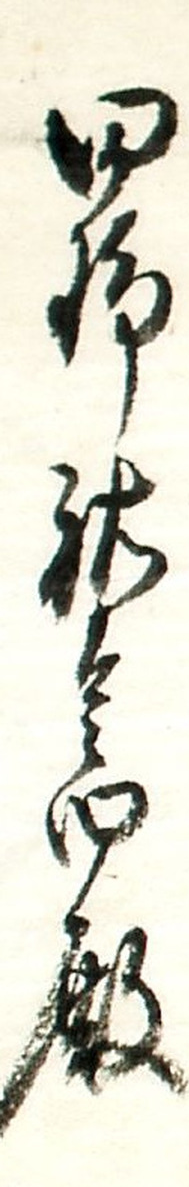田野祐太郎殿
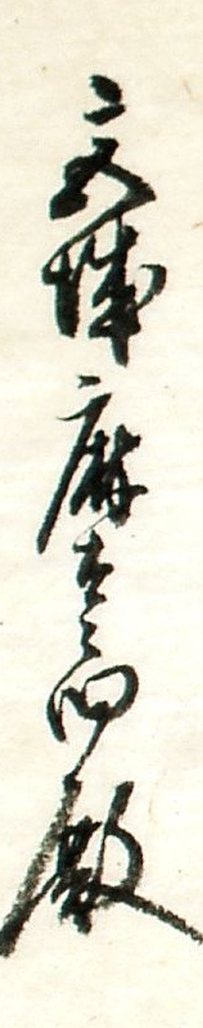宮城麻太郎殿

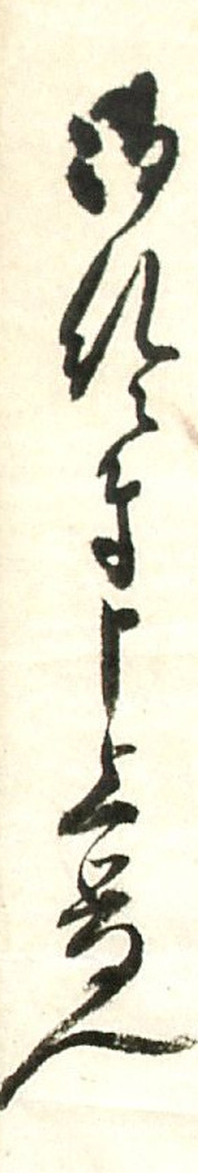御糺ニ付申上覚
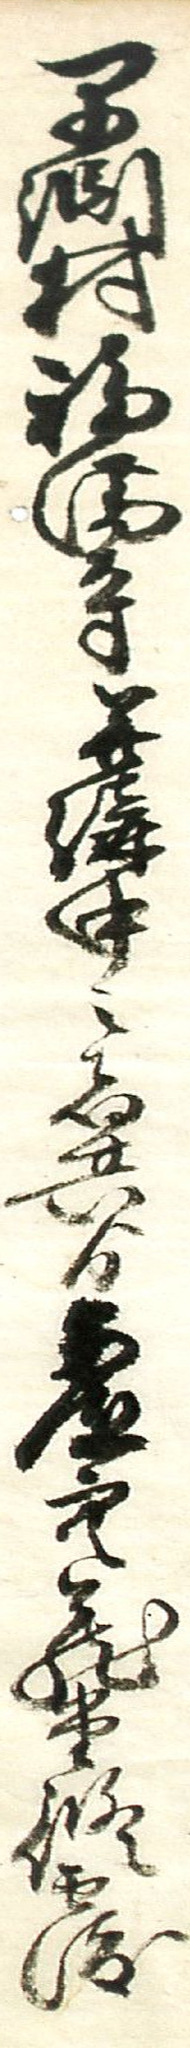早渕村福満寺幷講中之者共ゟ虚空蔵堂修覆
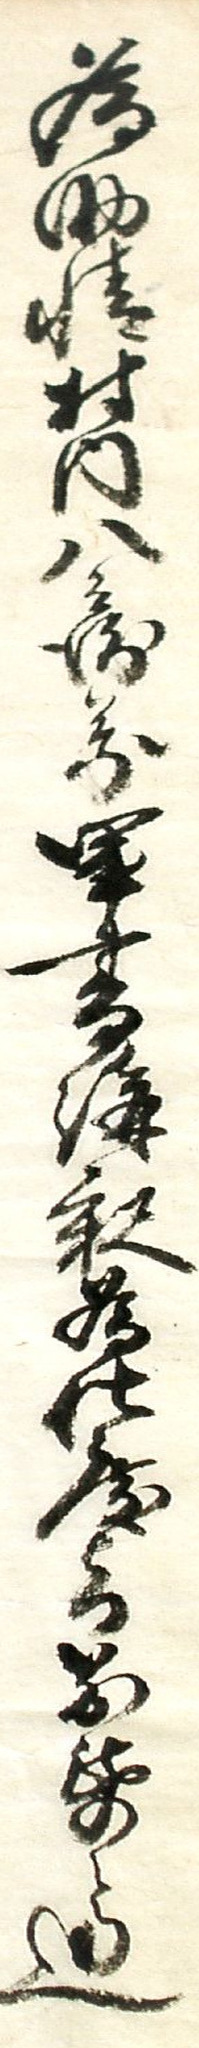為助情村内八兵衛義軍書講釈為仕度旨別帋之通
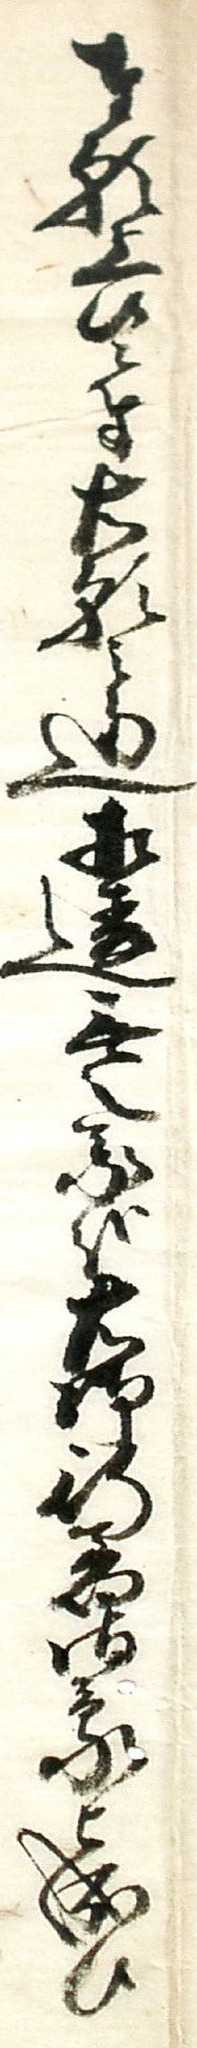奉願上候ニ付右願之通相違無之義哉右御行着御蒙被成候
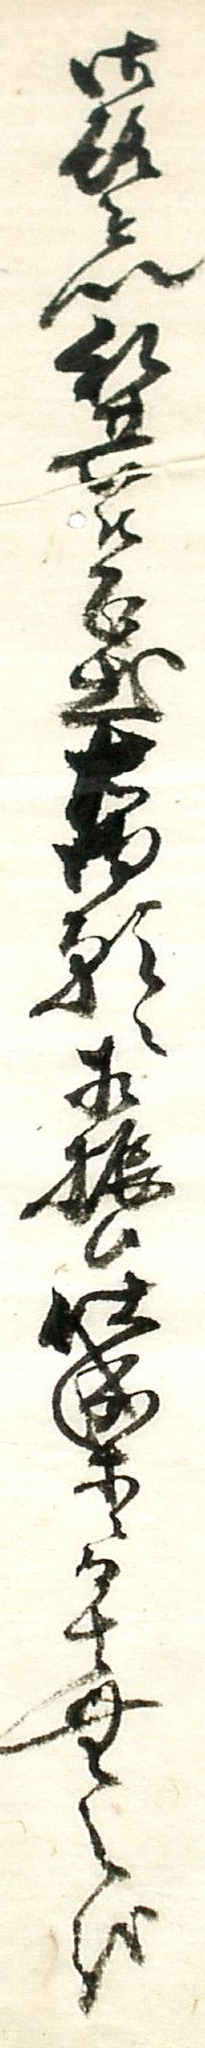御趣を以私共被召出右御願ニ相振候仕成等ニ而者無之哉
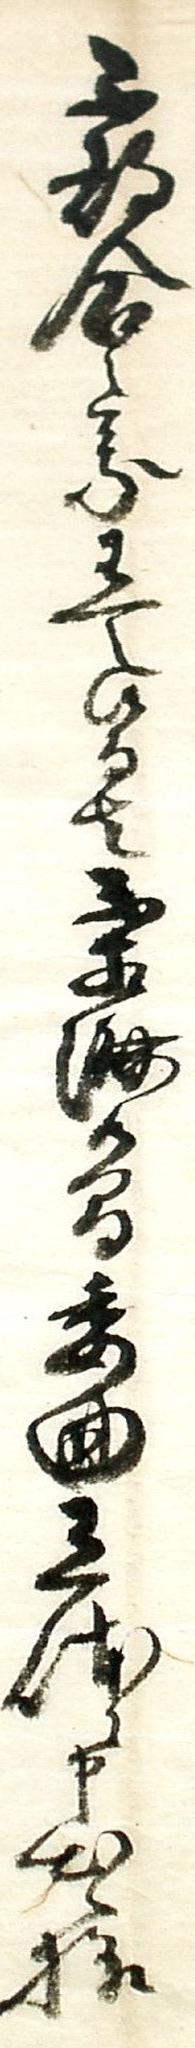不都合之義有之候而者不相済候間委曲有体ニ申出候様
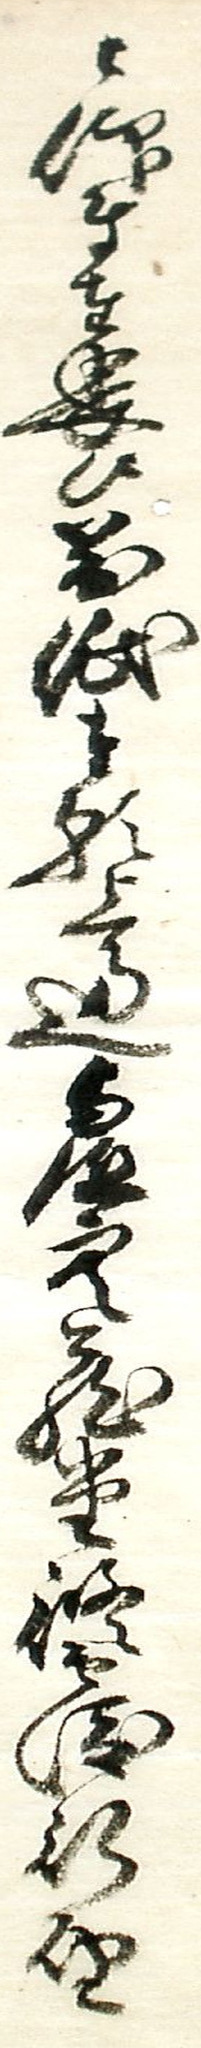被仰付奉畏候別紙奉願上通虚空蔵堂修覆行届
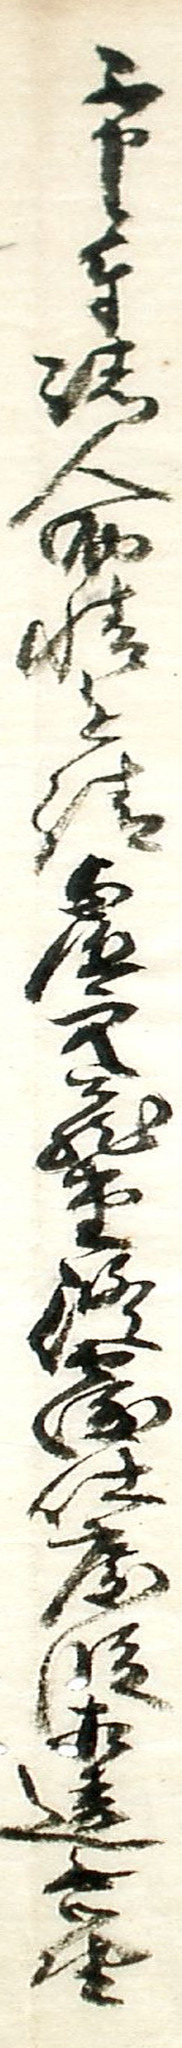不申ニ付諸人助情を請虚空蔵堂修覆仕度段相違無御坐
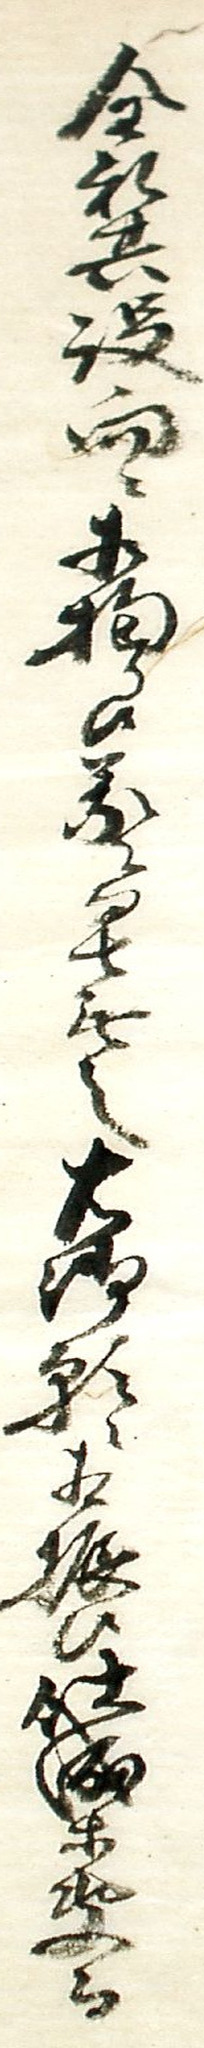全私共役向ニ相拘り候義ニ而者無之右御願ニ相振候仕成等決而
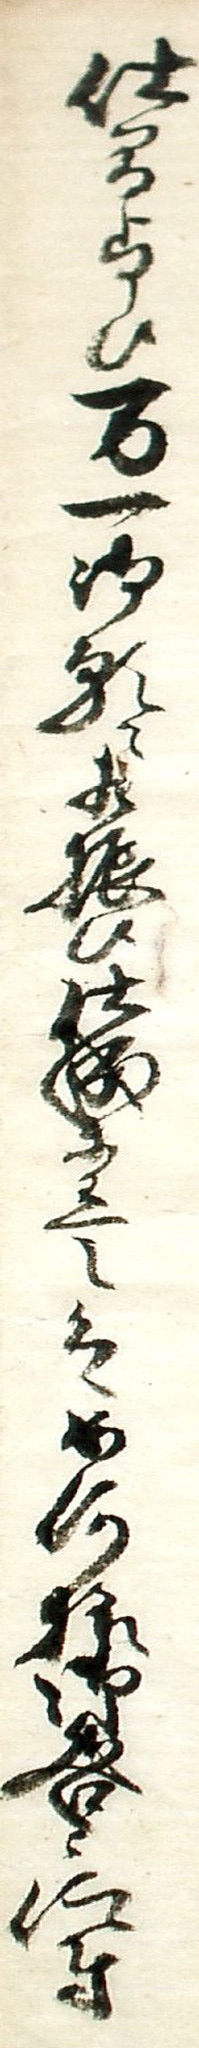仕間布候万一御願ニ相振候仕成等有之候ハヽ如何様御咎被仰付
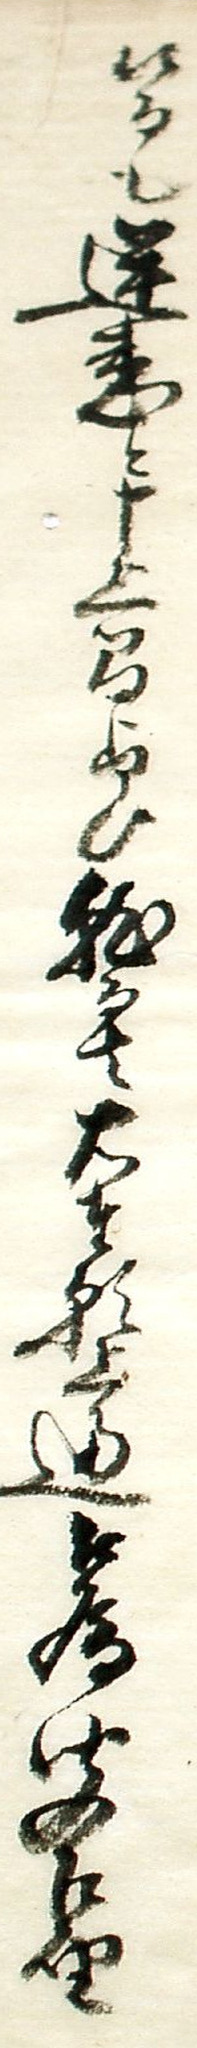候而も迷惑と申上間布候就而者右奉願上通被為聞召届
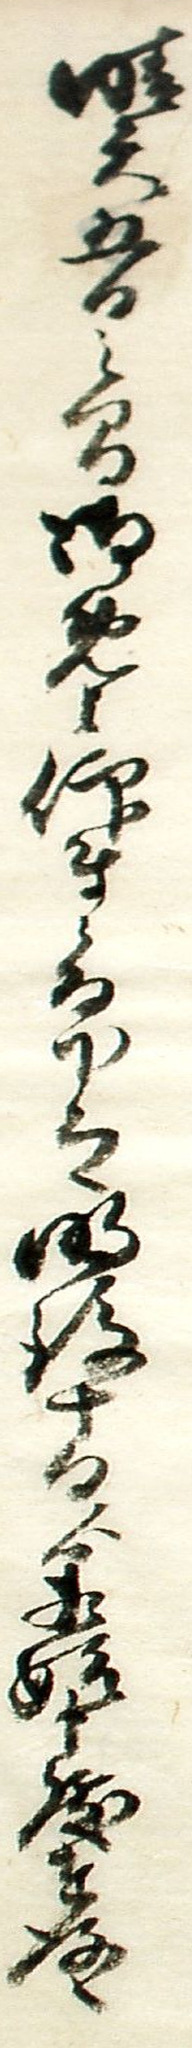晴天五日之間御免被仰付被為下候ハヽ明後十日ゟ相始申度奉存候
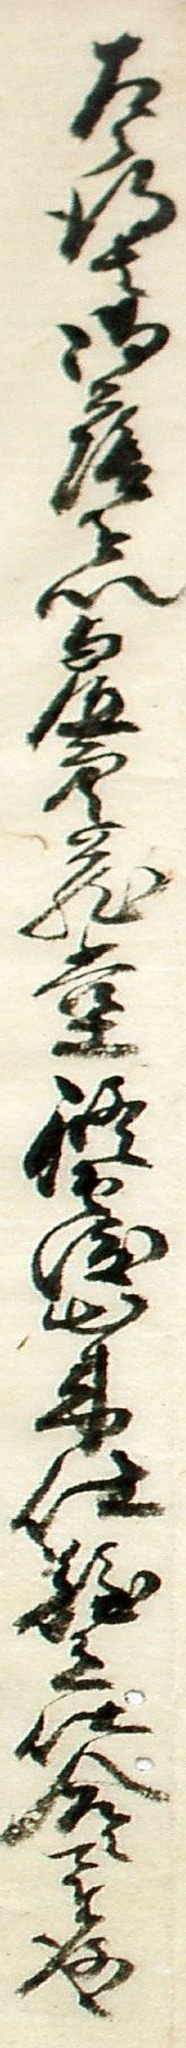右候得者御蔭を以虚空蔵堂修覆出来仕難有仕合ニ可奉存候
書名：(早渕村福満寺子ども浄瑠璃願紙面）他
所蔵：鳴門教育大学 Naruto University of Education
